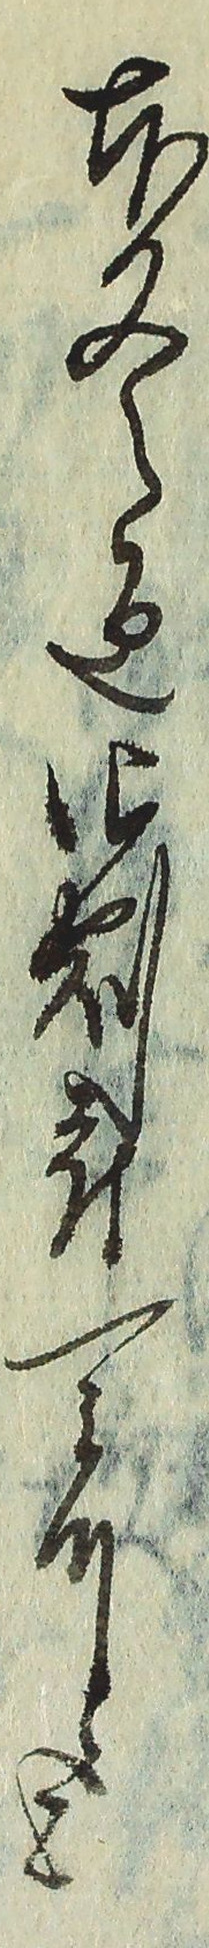本文之通御割苻可被下候以上
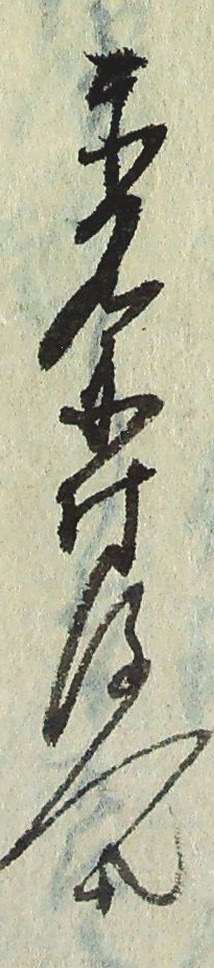東名東村役人共
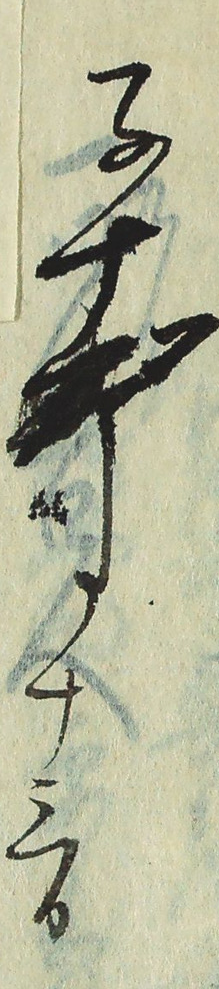子十一月十三日
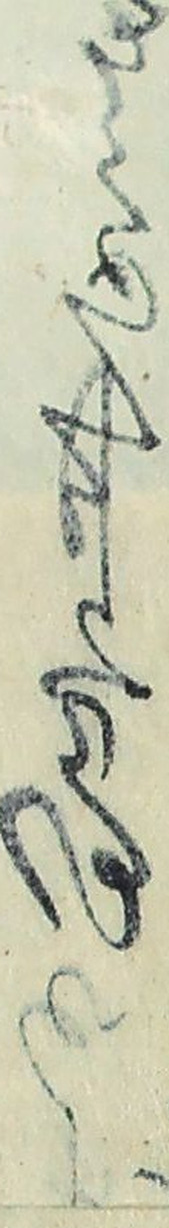子十一月十三日

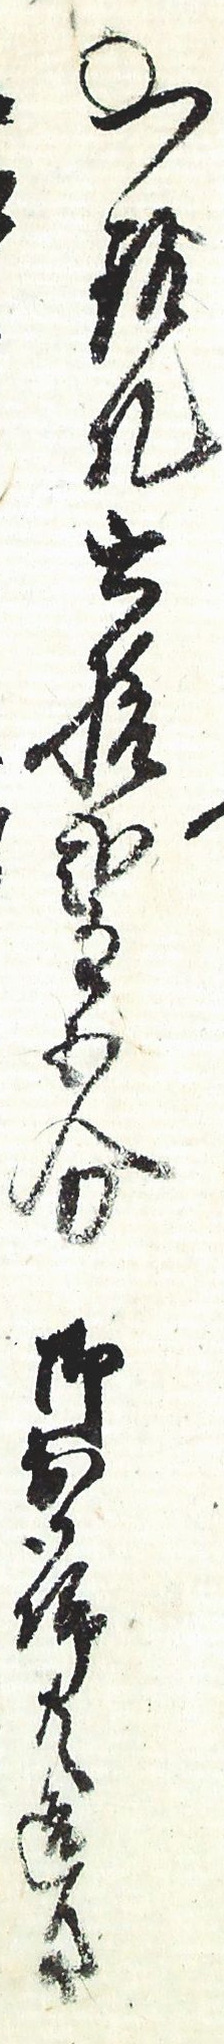一銀札六拾弐匁五分御出御帰共造用
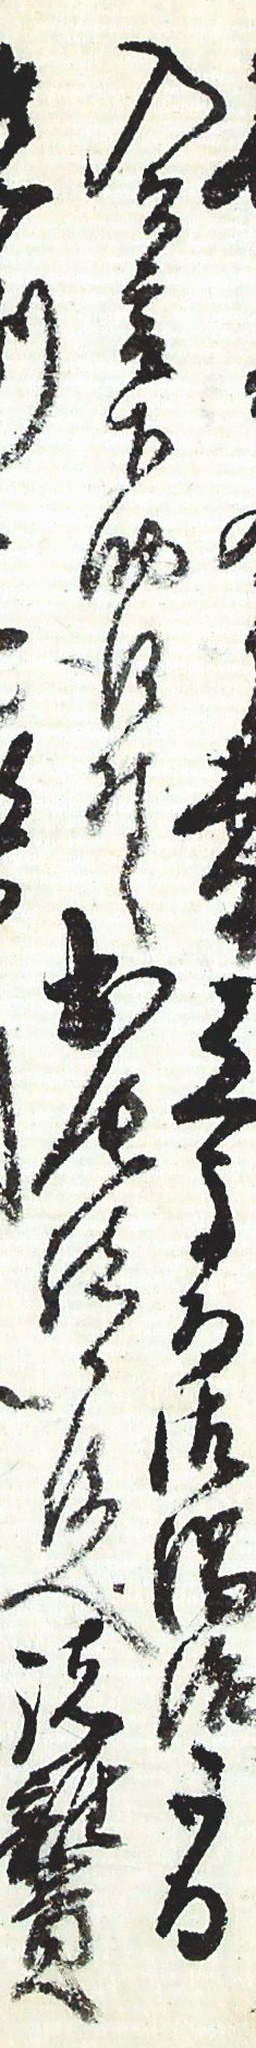入候節下助任村へ出張諸御役人諸雑費
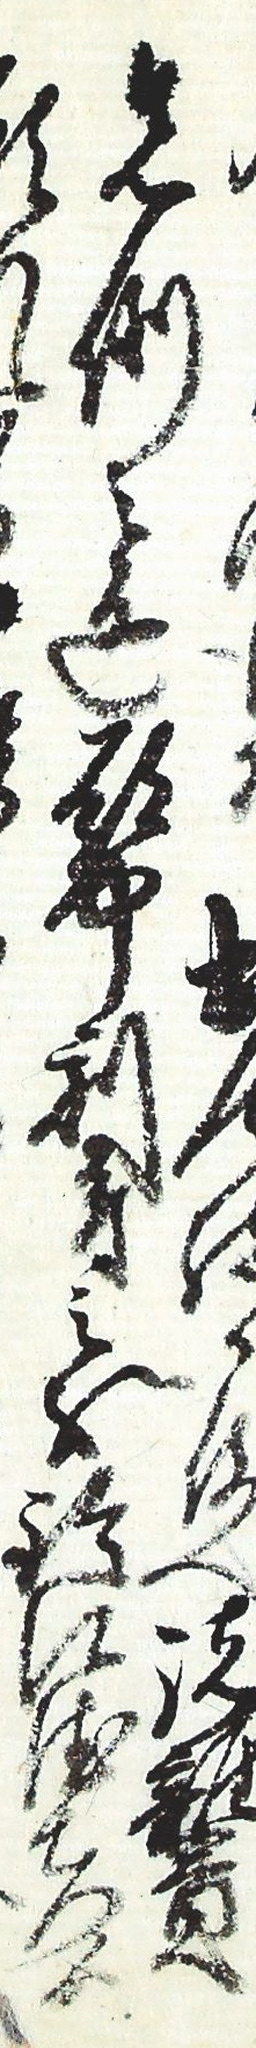先例之通郡中割苻之義鈴江徳右衛門ゟ
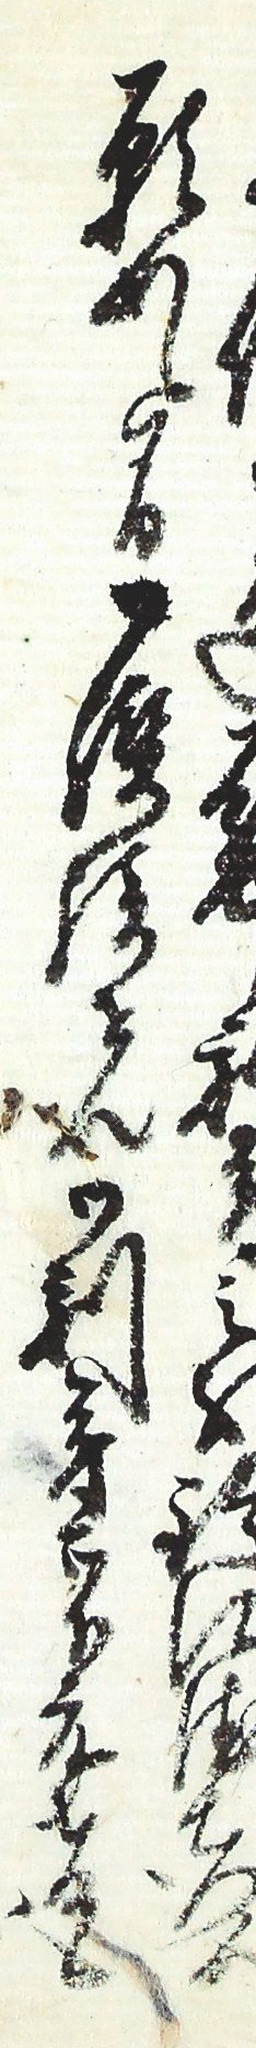願出候間御讃談を以御割苻被下度奉存候
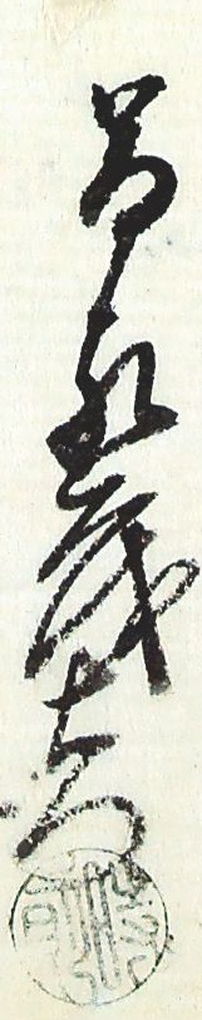富永茂右衛門印
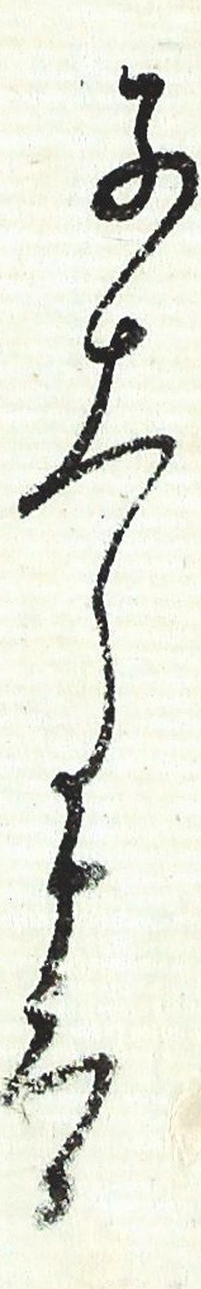子十一月十三日
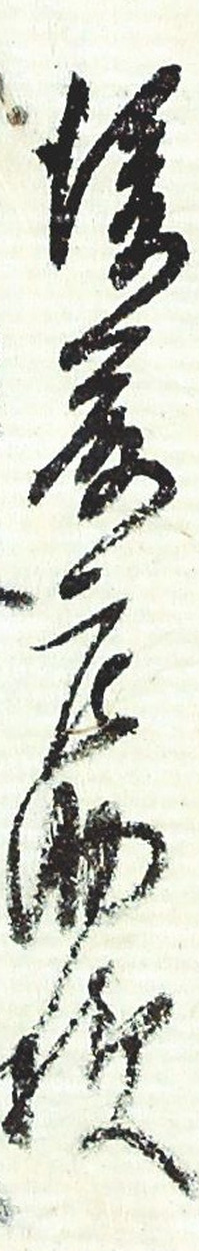後藤庄助様
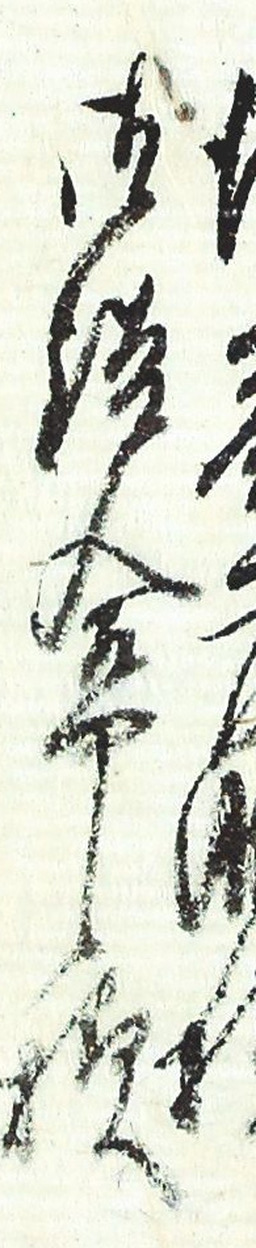御談合中様

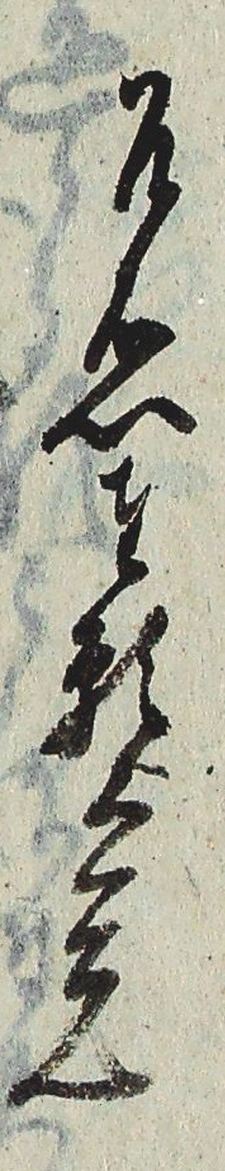乍恐奉願上覚
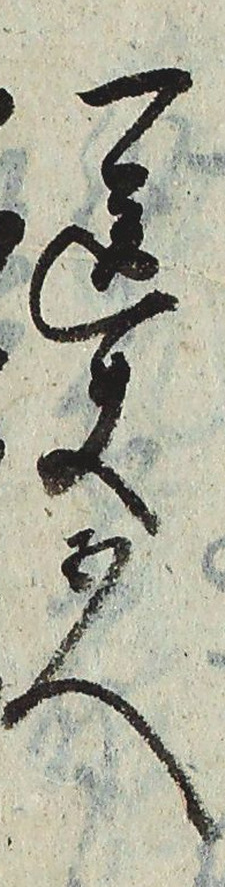一送夫五人
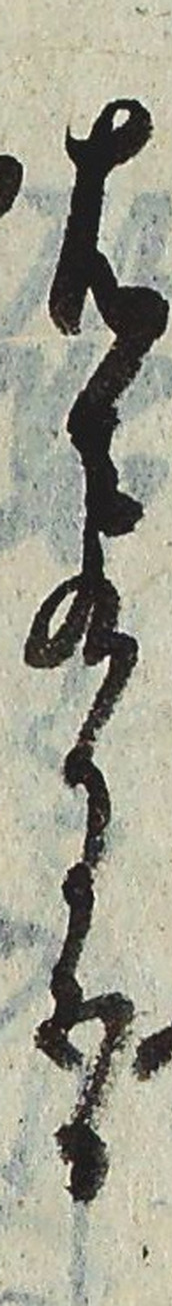右は九月五日
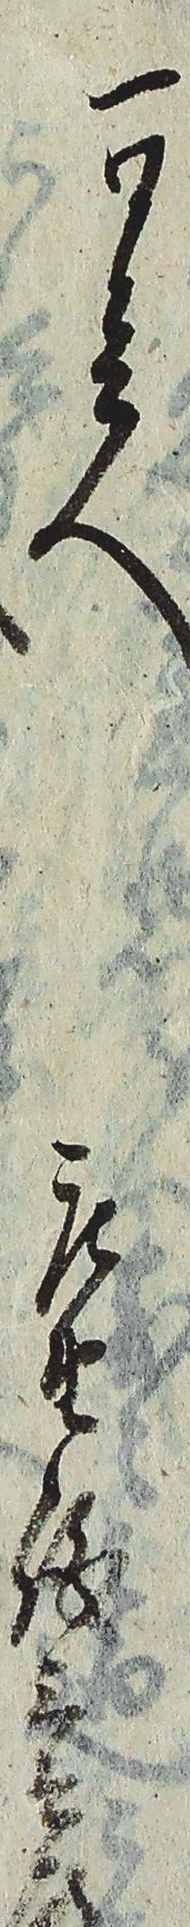一同壱人庄野儀三太殿
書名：名東郡中諸割賦元帳
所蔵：鳴門教育大学 Naruto University of Education
